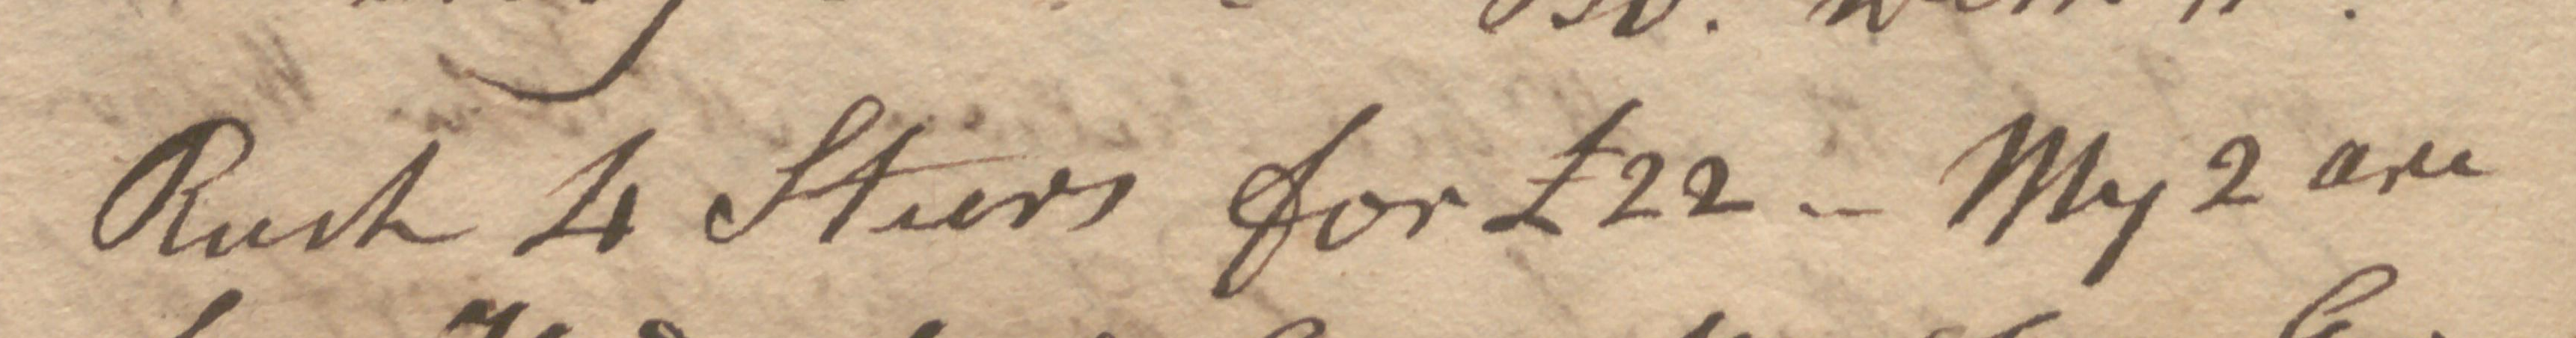Rush 4 Steers for £22.- My 2 are
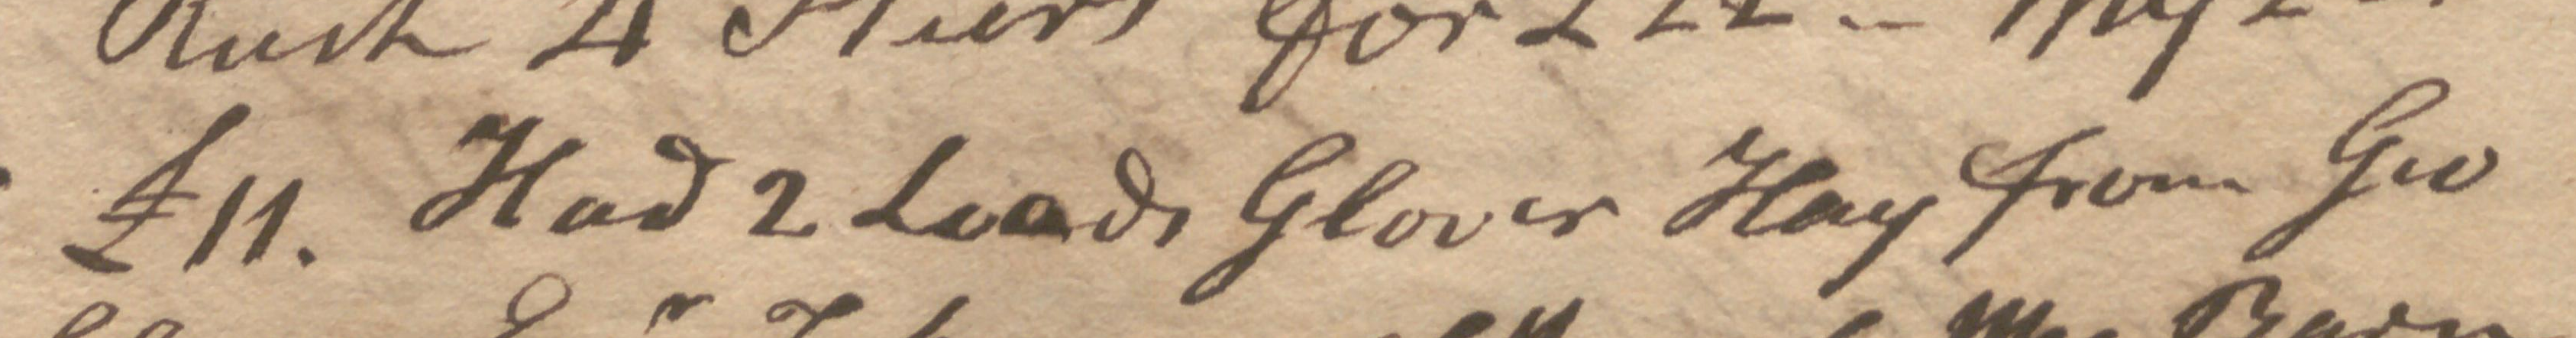£11. Had 2 Loads Glover Hay from Geo
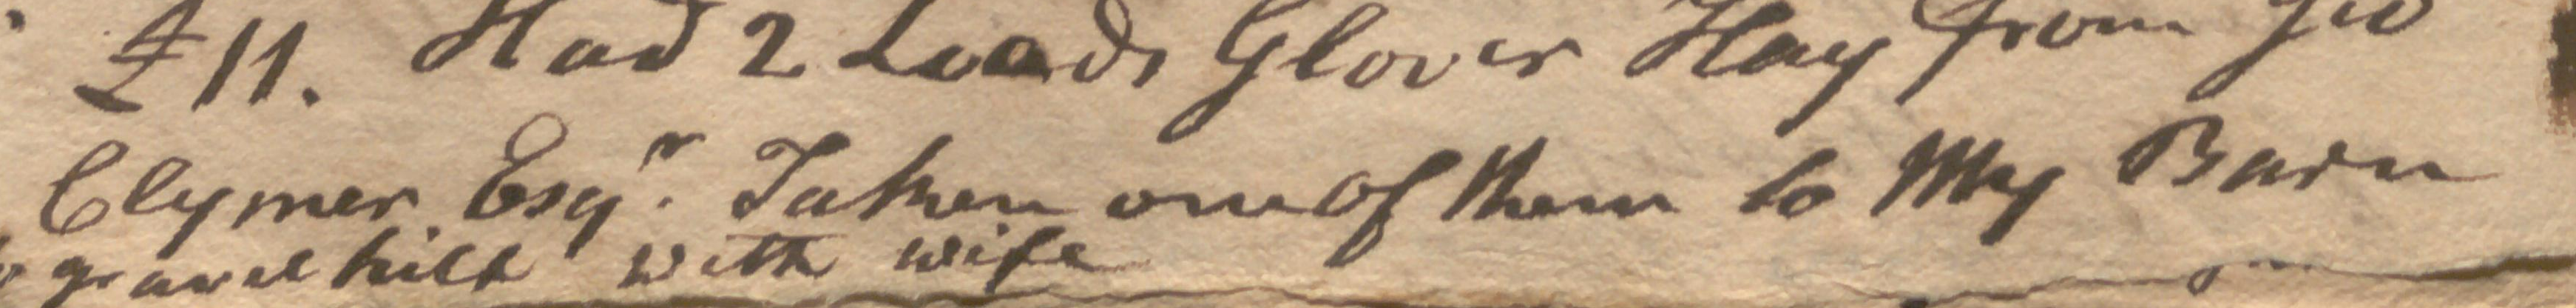Clymer Esq^r. Taken one of them to My Barn
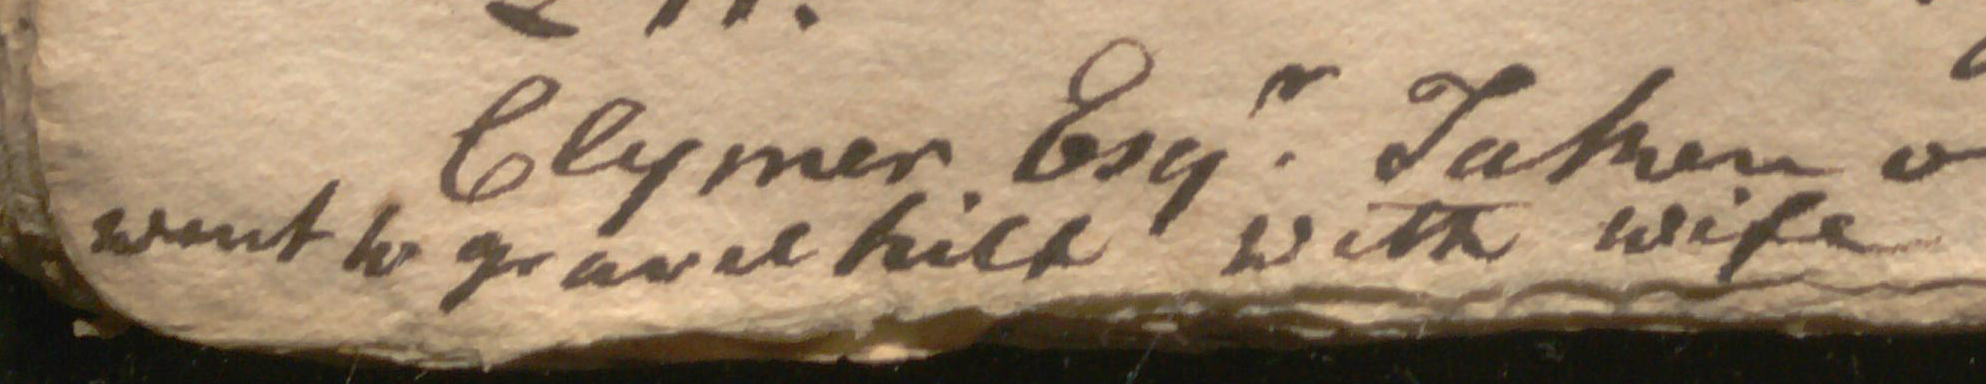went to gravel hill with wife
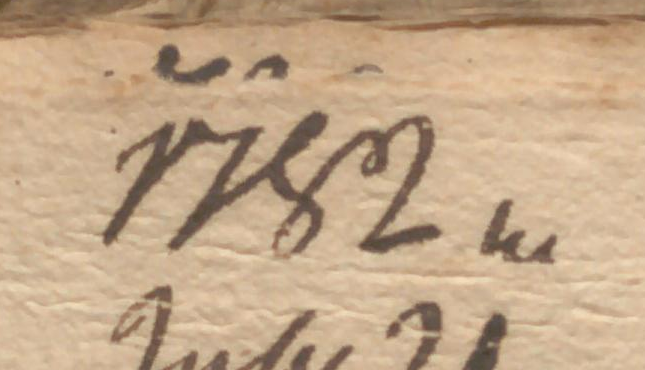1782
